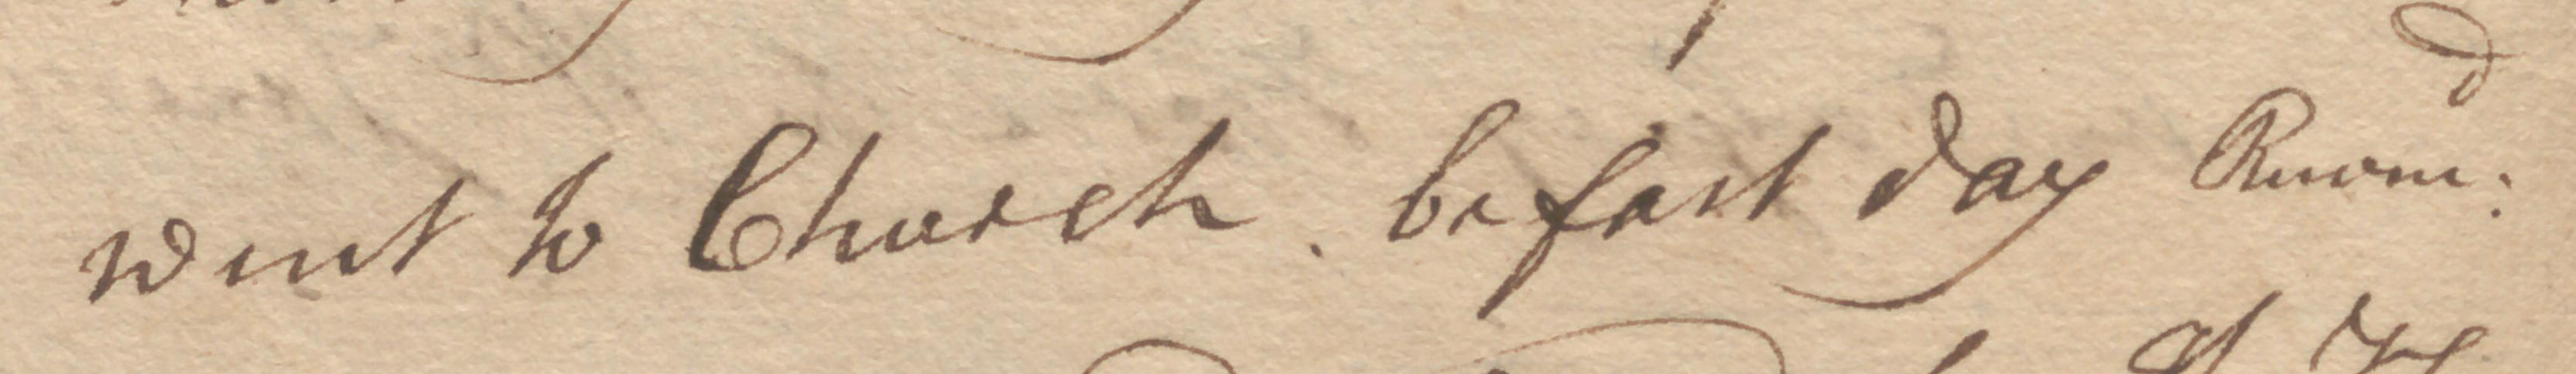went to Church befast day Recom^d.
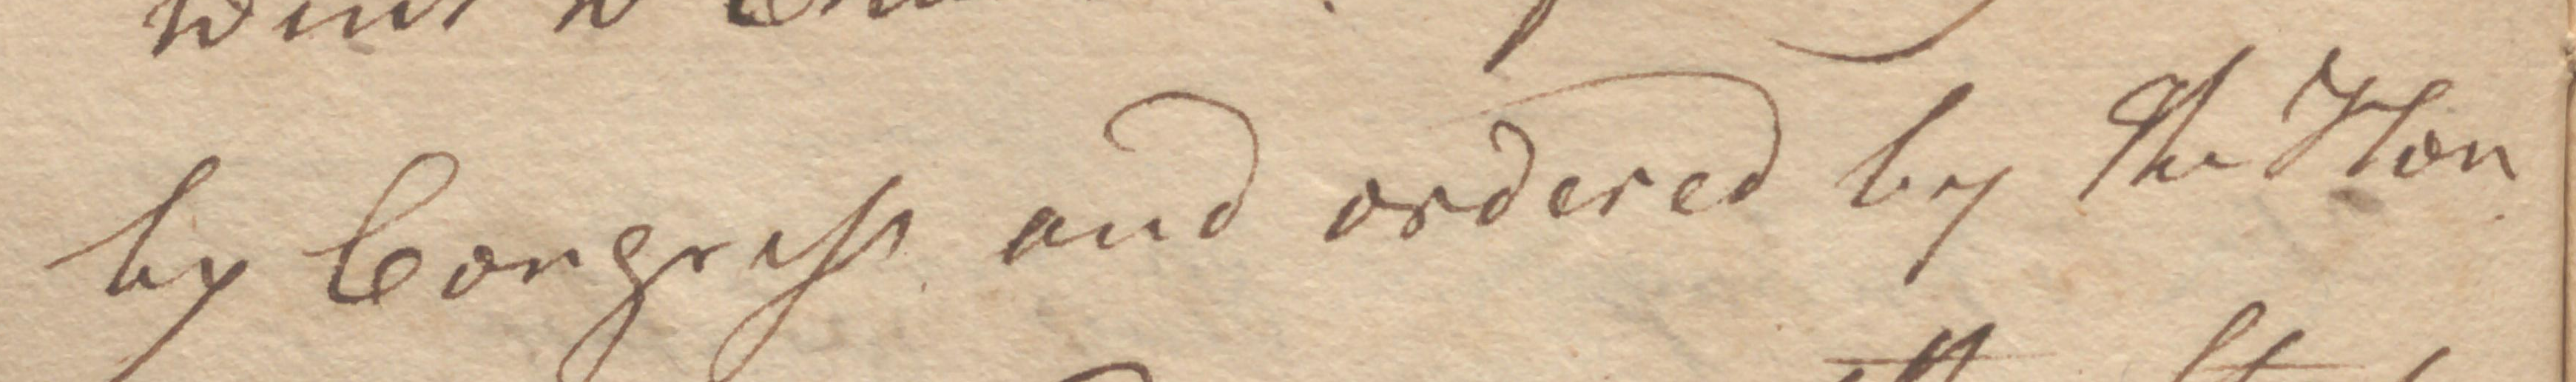by Congress and ordered by the Hon
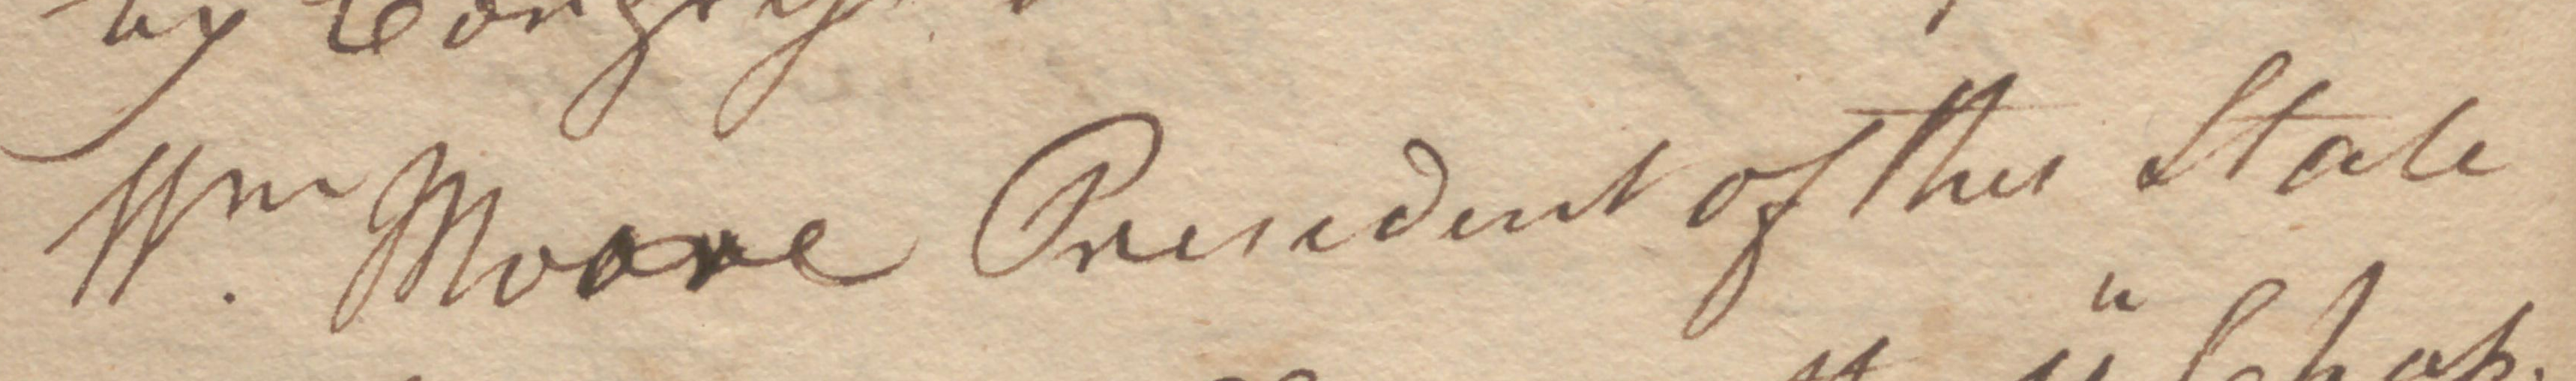W^m. Moore President of this State
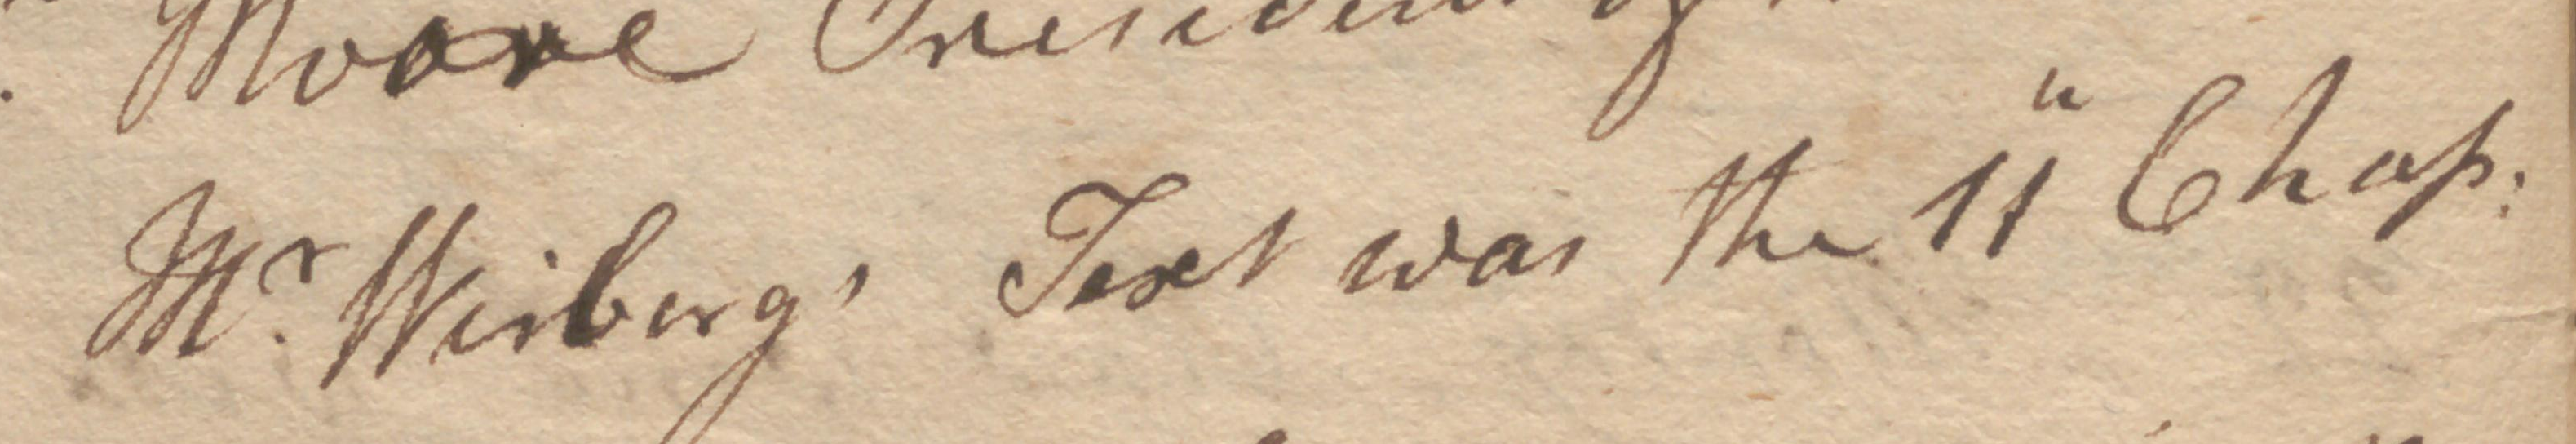M^r. Weibergs Text was the 11^th Chap
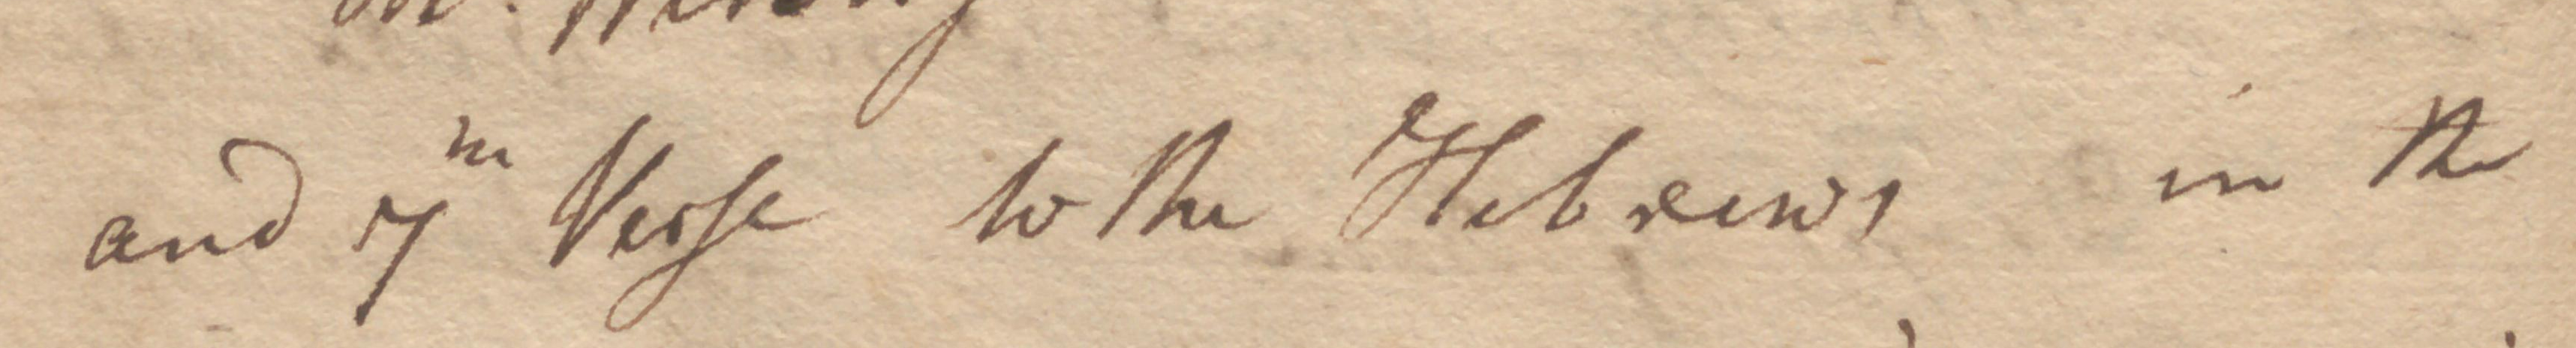and 7^th Verse to the Hebrews in the
